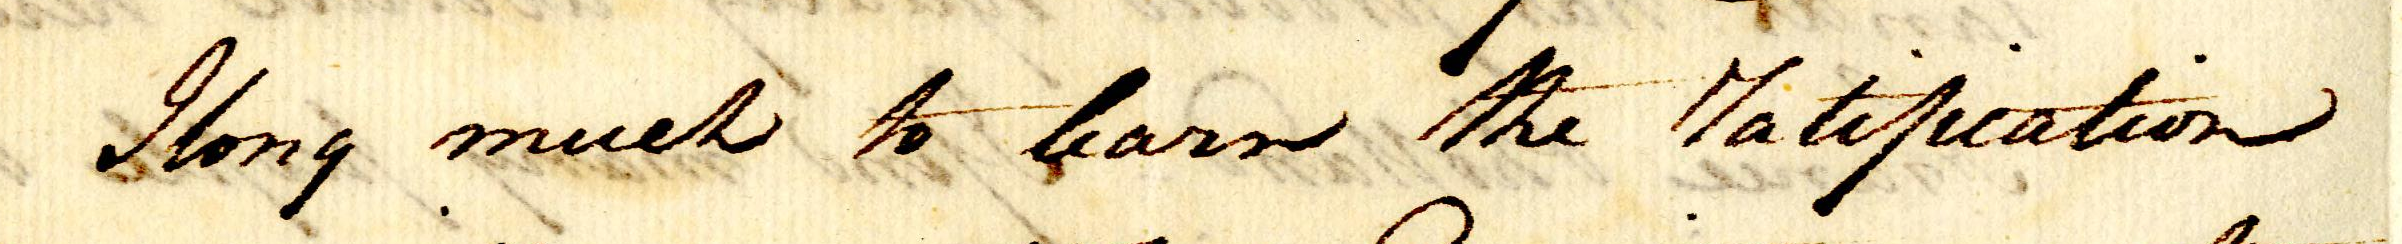I long much to learn the satisfaction
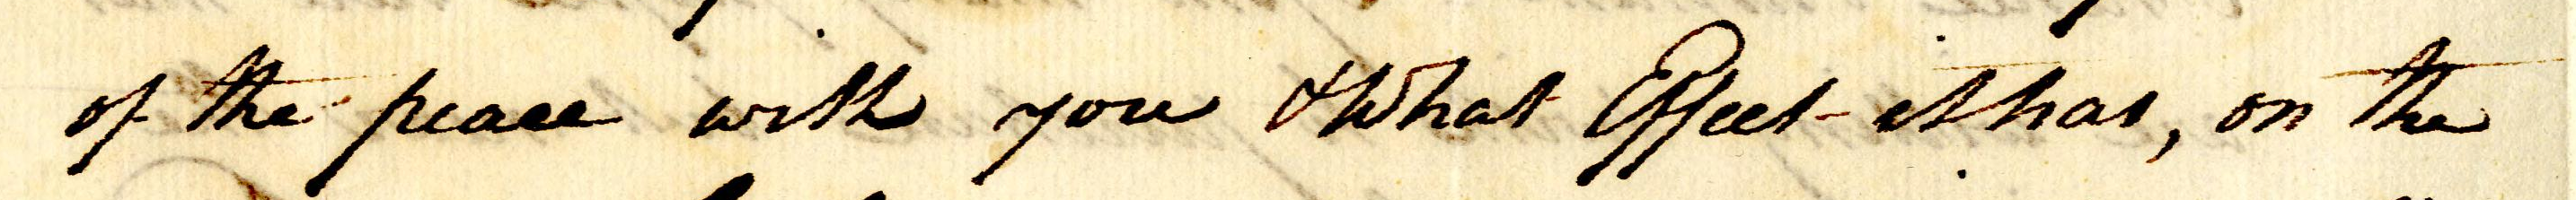of the place with you & what Effect it has, on the
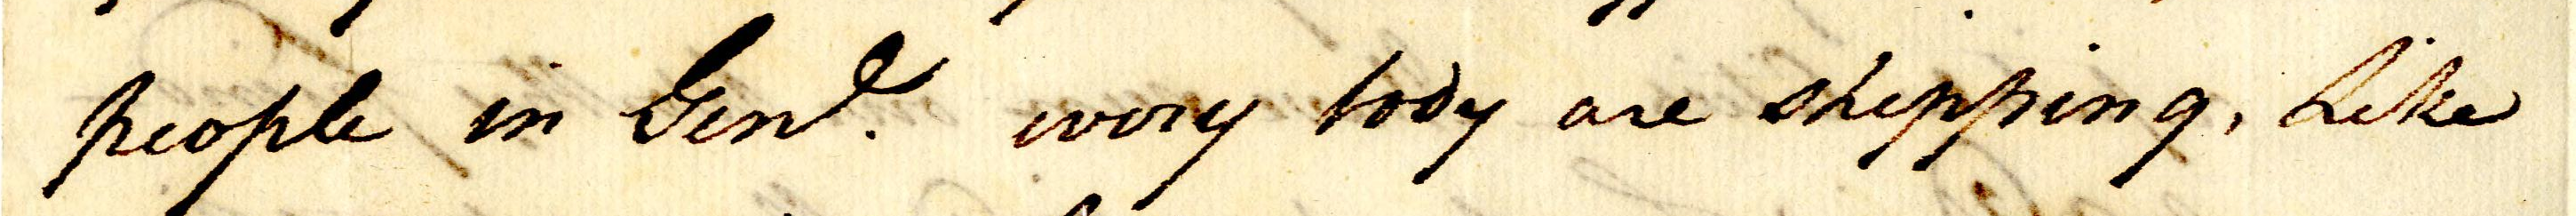people in Gen^l. every body are shipping, like
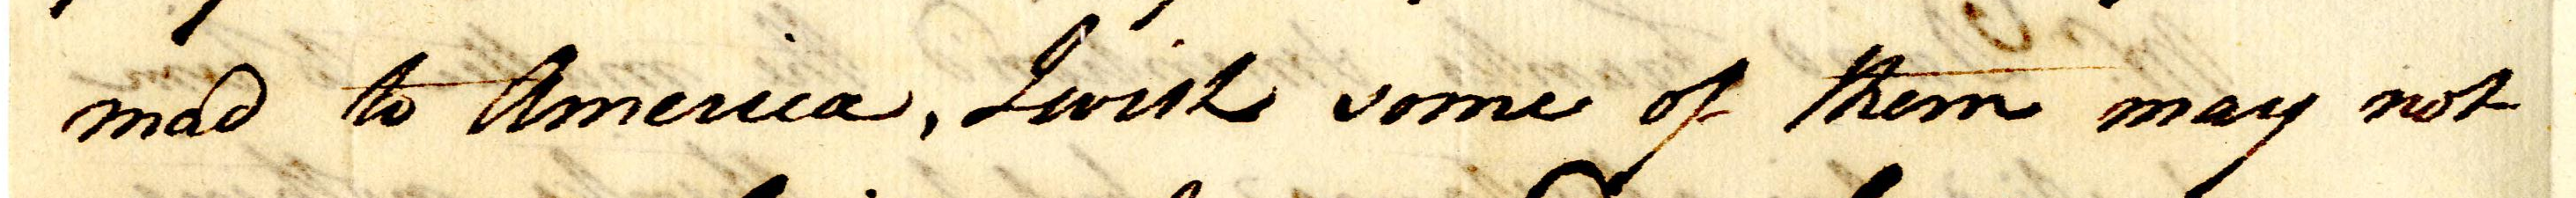mad to America, I wish some of them may not
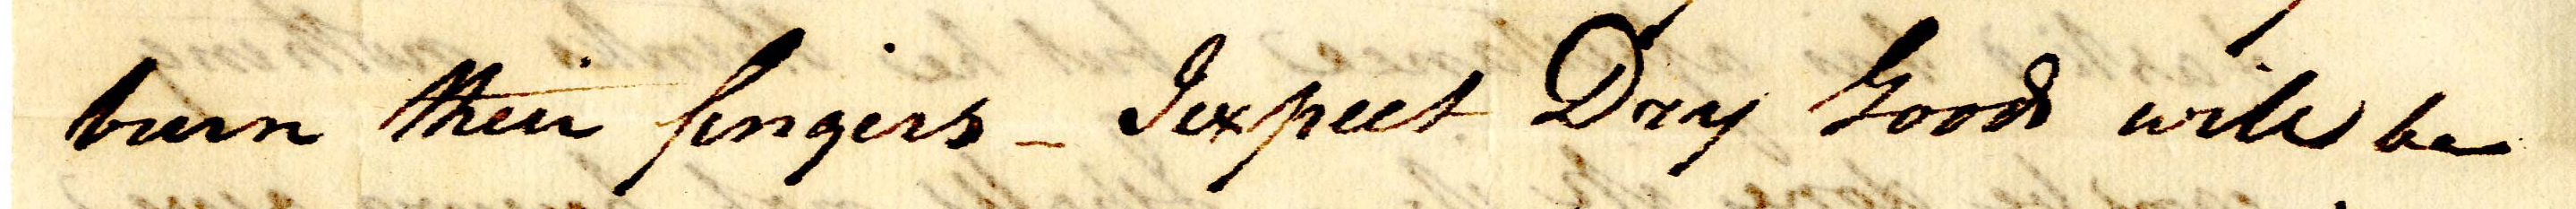burn their fingers- I expect Dry Good will be
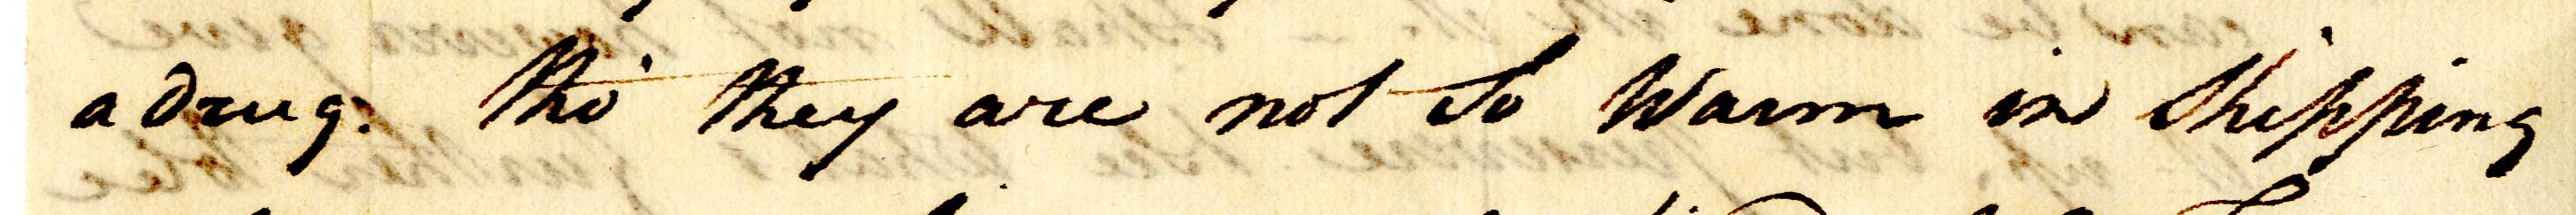a drag.- tho' they are not so warm in shipping
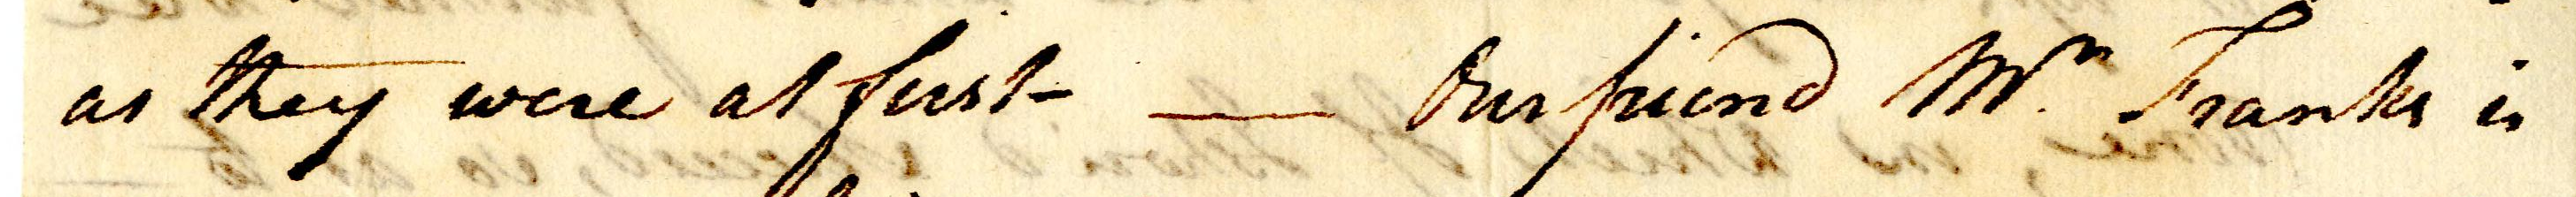as they were at first- Our friend M^r. Franks is
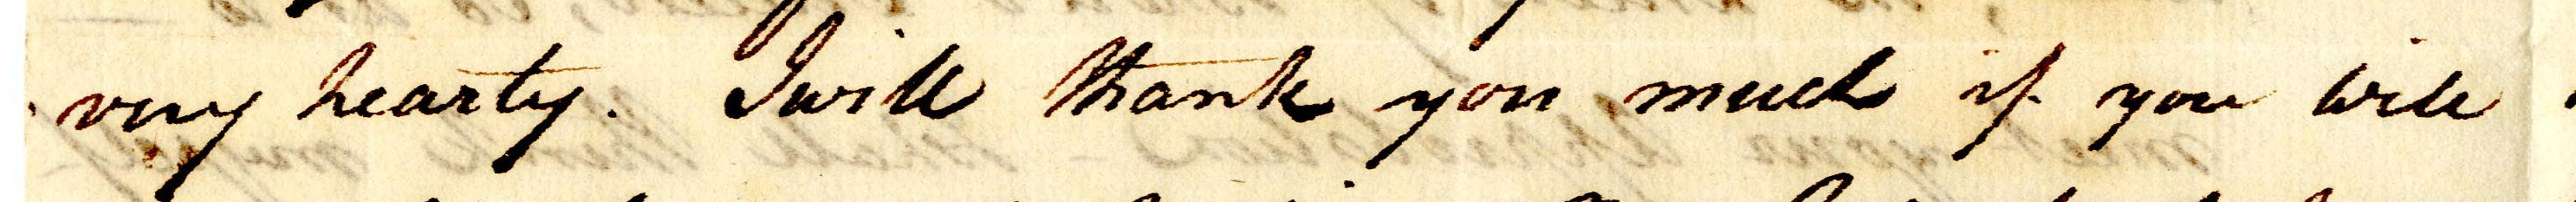very hearty. I will thank you much if you will
